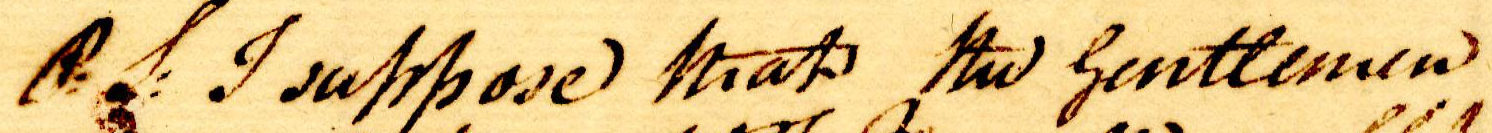P.S. I suppose that the Gentlemen
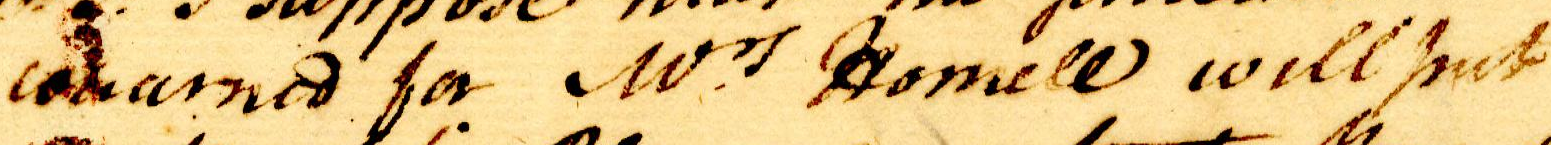concerned for M^rs. Homell will put
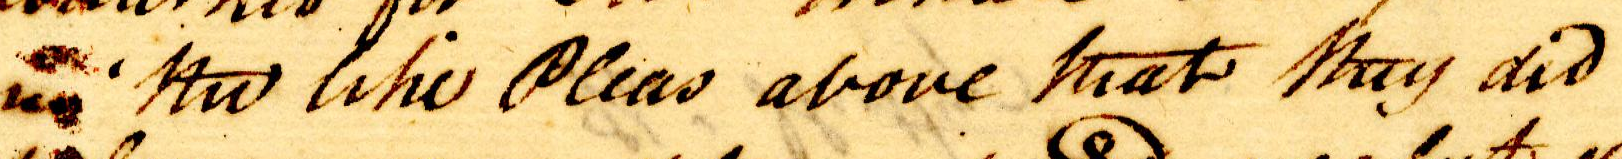in the like Pleas above that they did
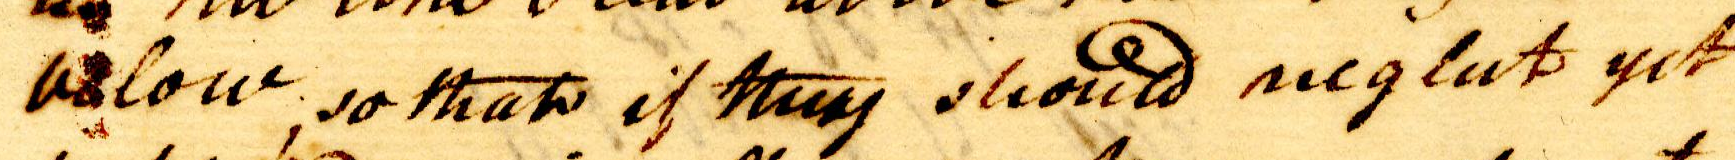below, so that if they should neglect yet
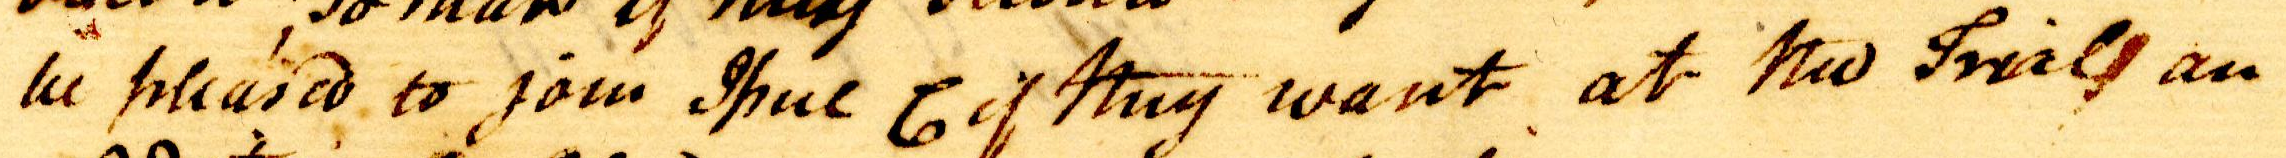be pleased to join Issue (if they want at the Trial an
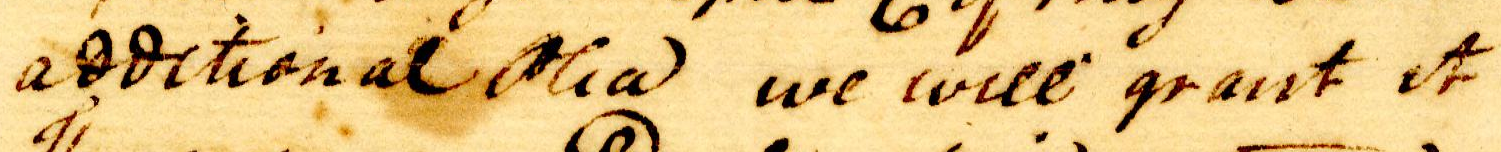additional Plea) we will grant it
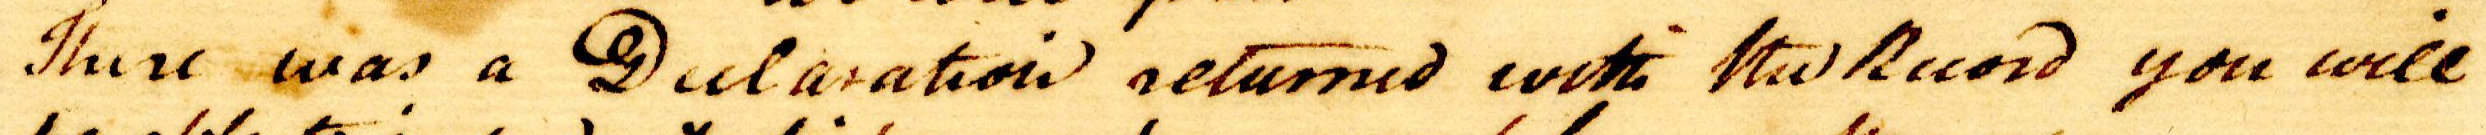There was a Declaration returned with the Record you will
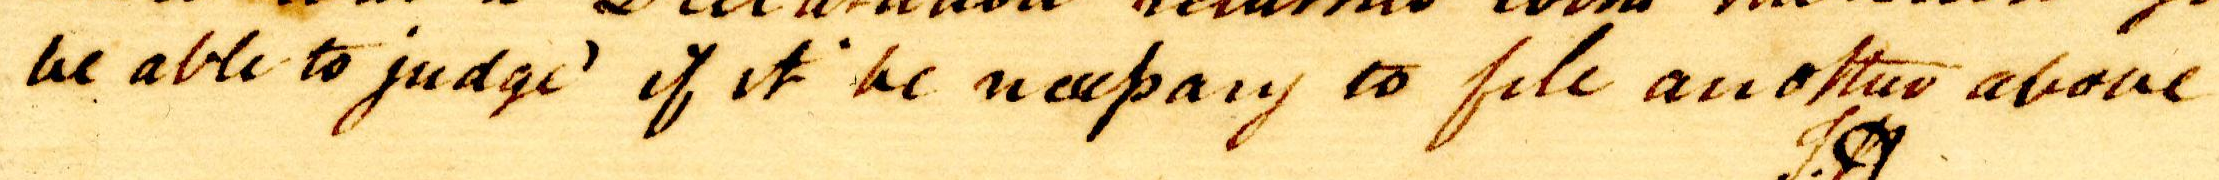be able to judge if it be necessary to file another above
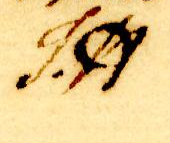T.H
